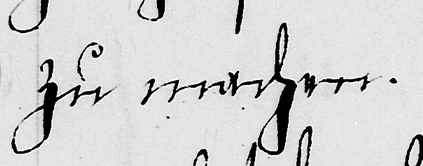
zu machen.
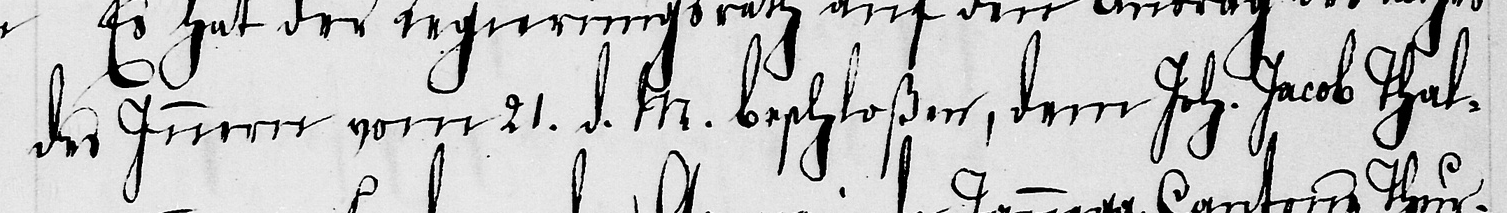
des Innern vom 21. d. M. beschloßen, dem Joh. Jacob Thal¬
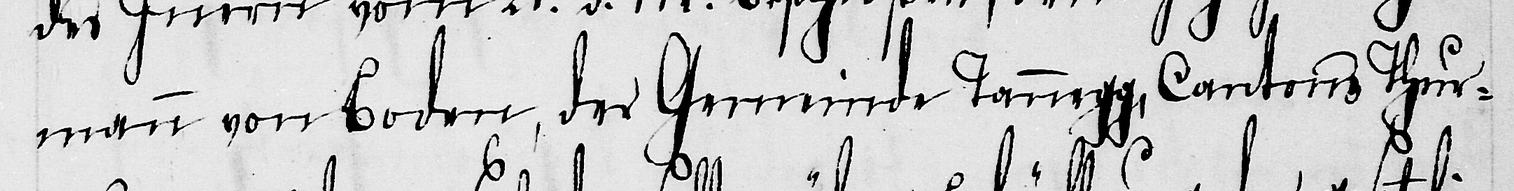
mann von Boden, der Gemeinde Tannegg, Cantons Thur¬
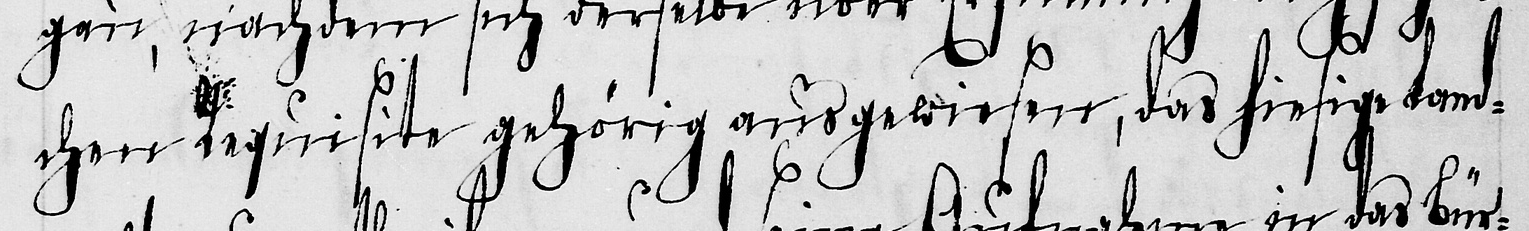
ichen Requisite gehörig ausgewiesen, das hiesige Land¬
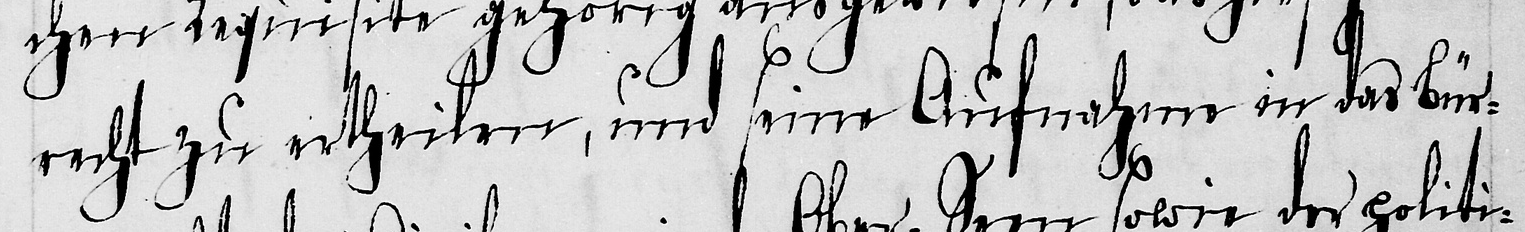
recht zu ertheilen, und seine Aufnahme in das Bür¬
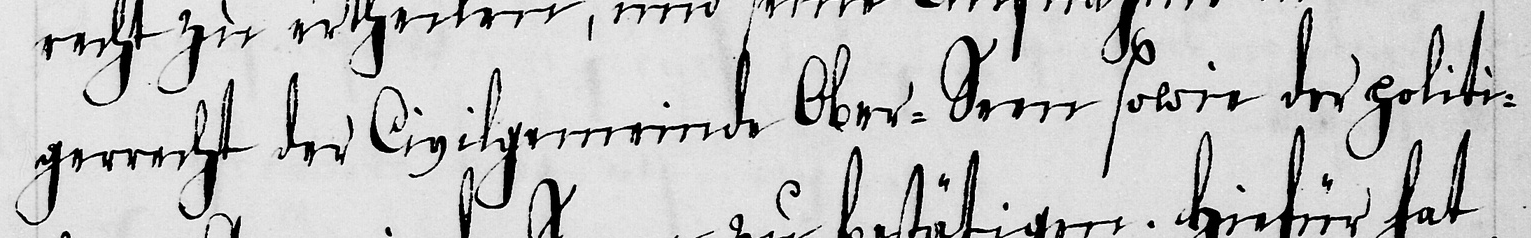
gerrecht der Civilgemeinde Ober-Seen sowie der politi¬
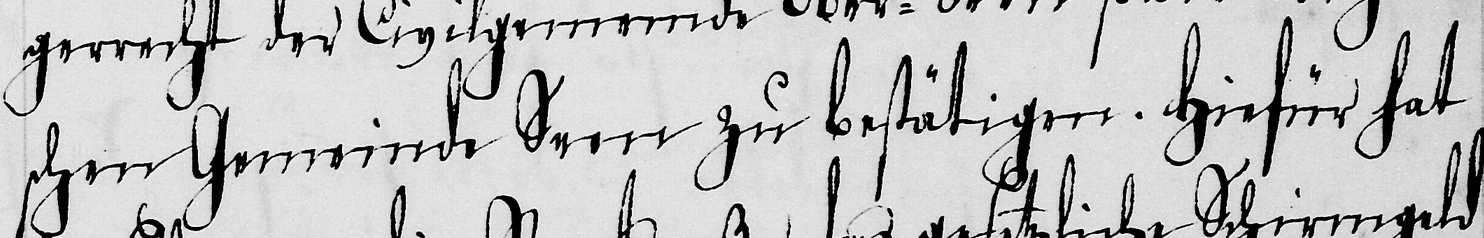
schen Gemeinde Seen zu bestätigen. Hierfür hat
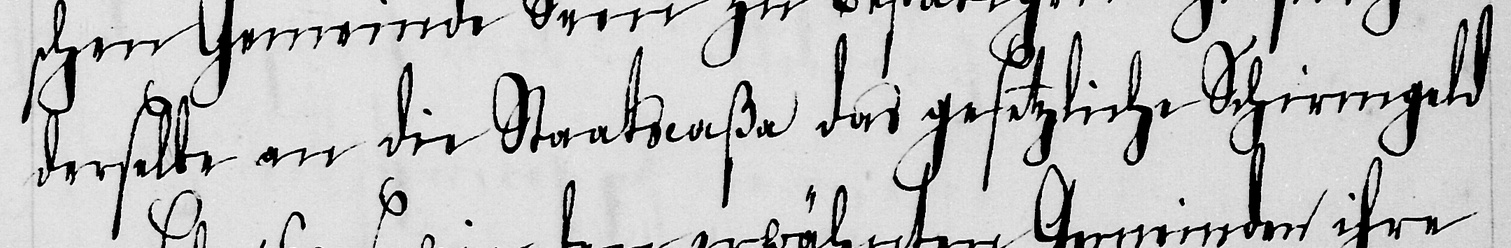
derselbe an die Staatscaßa das gesetzliche Schirmgeld
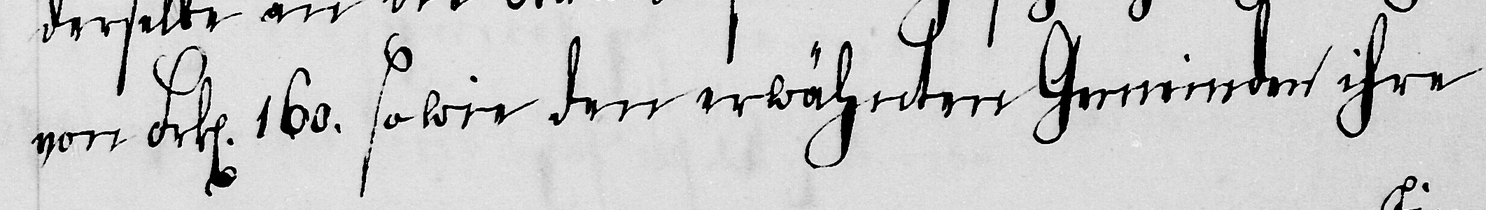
von Frk[en]. 160. sowie den erwähnten Gemeinden ihre
